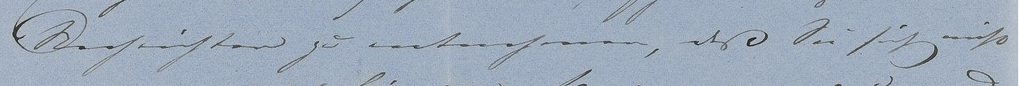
Nachrichten zu entnehmen, daß Sie sich nicht
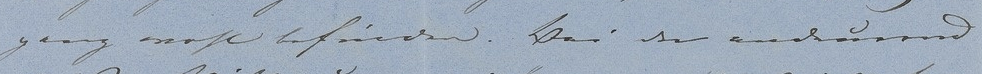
ganz wohl befinden. Bei der andauernd
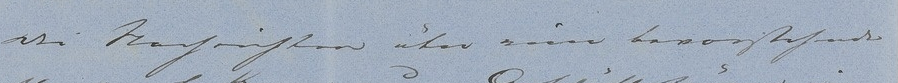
Die Nachrichten über eine bevorstehende
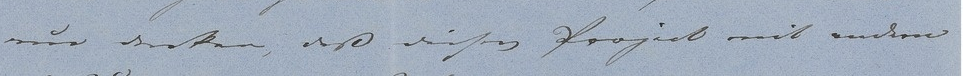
nur denken, daß dieses Project mit andern
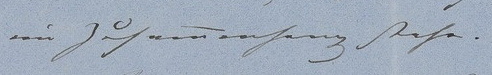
im Zusammenhang stehe.
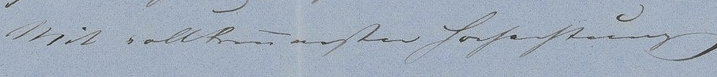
Mit vollkommenster Hochachtung
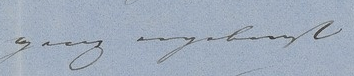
ganz ergebenst
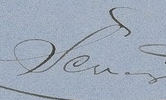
Schweizer
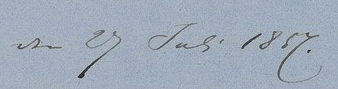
den 27 Juli 1857.
